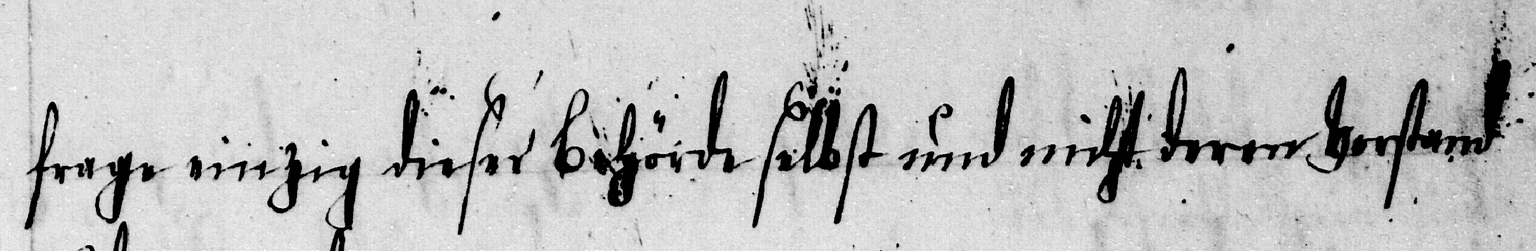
frage einzig dieser Behörde selbst und nicht deren Vorstand
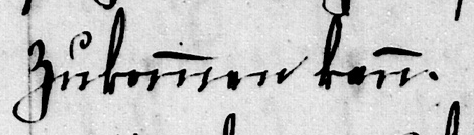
zukommen kann.
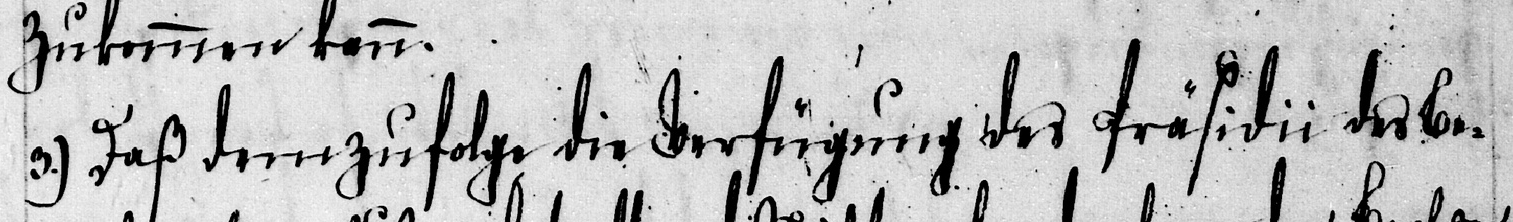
3.) Daß demzufolge die Verfügung des Präsidii des Be¬
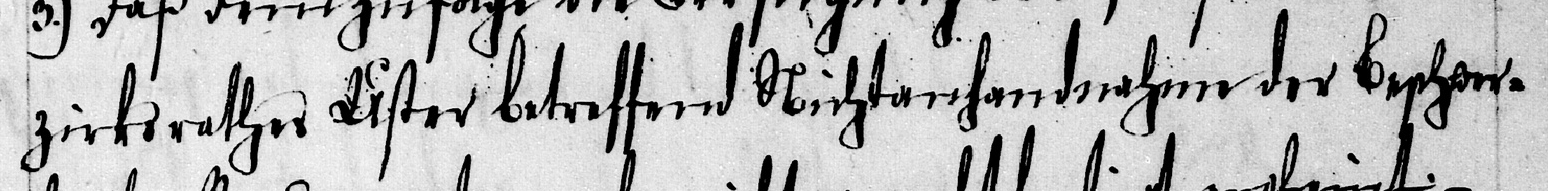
zirksrathes Uster betreffend Nichtanhandnahme der Beschwer¬
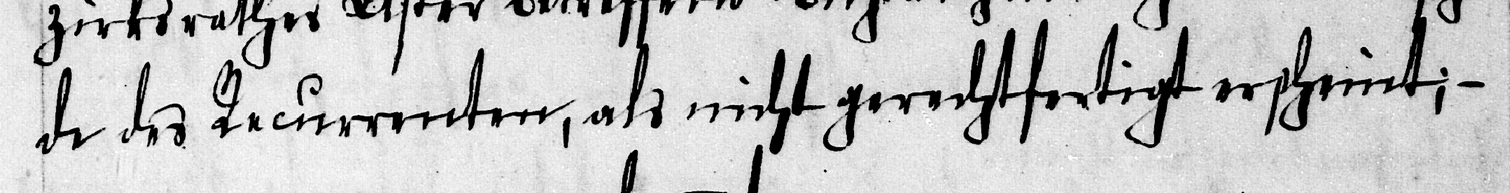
de des Recurrenten, als nicht gerechtfertigt erscheint: –
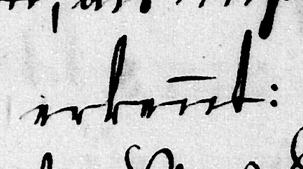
erkennt:
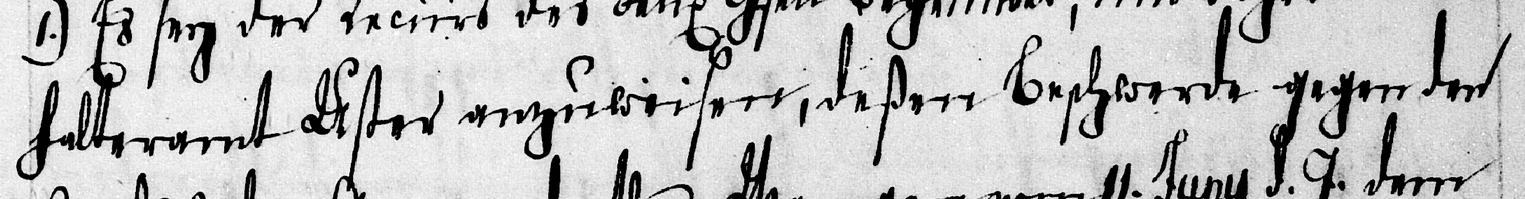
halteramt Uster anzuweisen, deßen Beschwerde gegen den
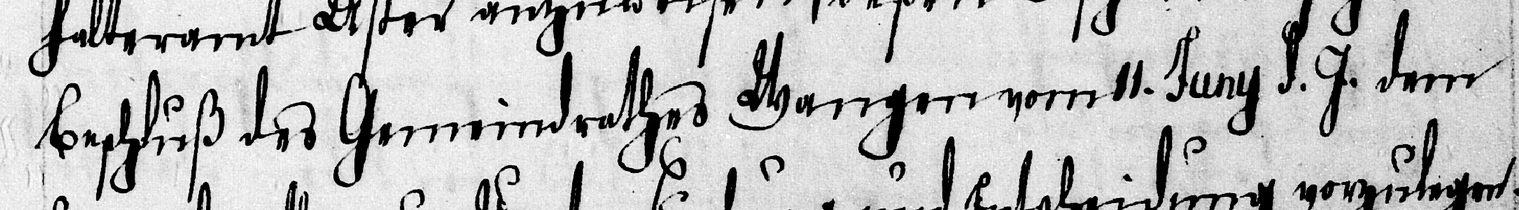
Beschluß des Gemeindrathes Wangen vom 11. Juny d. J. dem
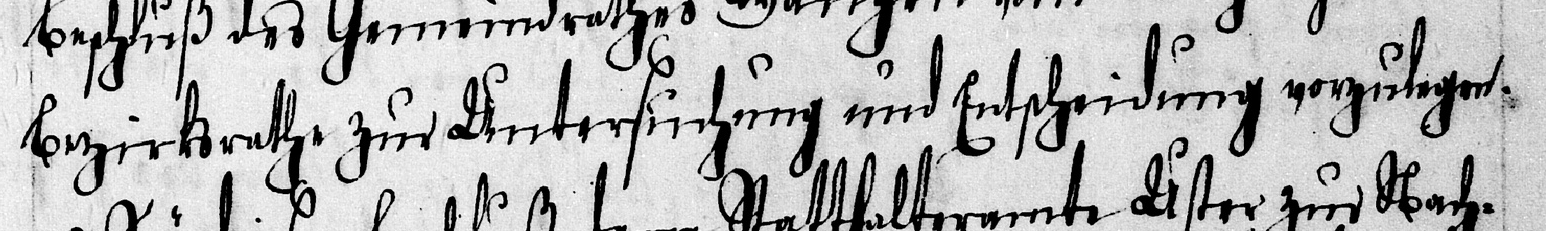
Bezirksrathe zur Untersuchung und Entscheidung vorzulegen.
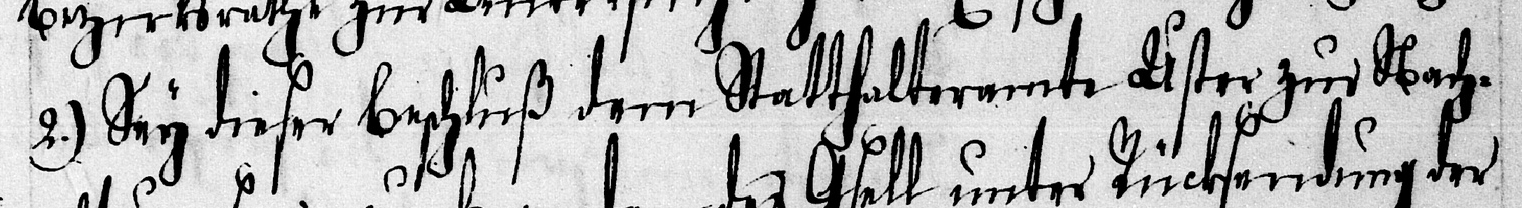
2.) Sey dieser Beschluß dem Statthalteramte Uster zur Nach¬
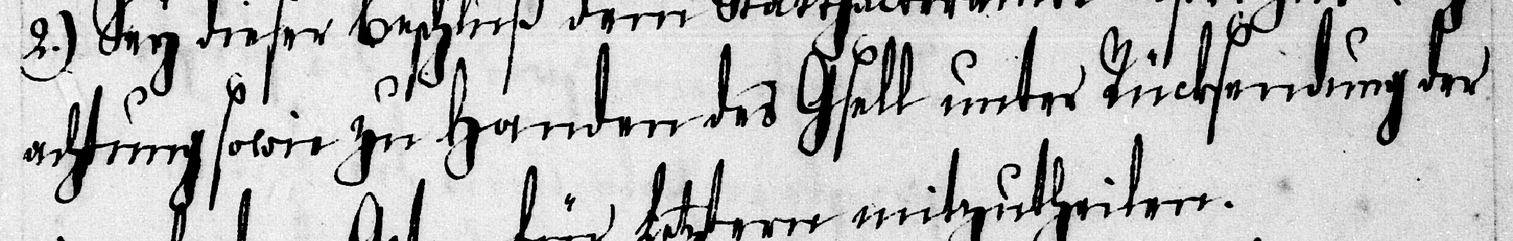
achtung sowie zu Handen des Gsell unter Rücksendung der
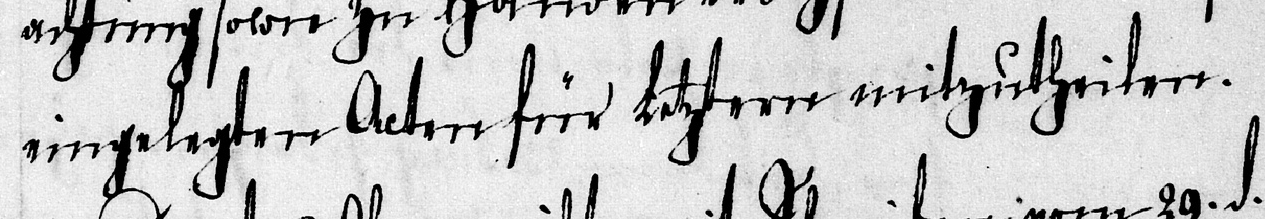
eingelegten Acten für Letztern mitzutheilen.
